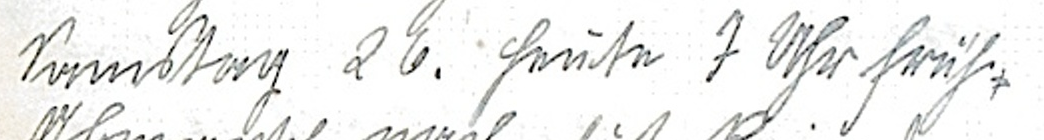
Samstag 26. Heute 7 Uhr früh
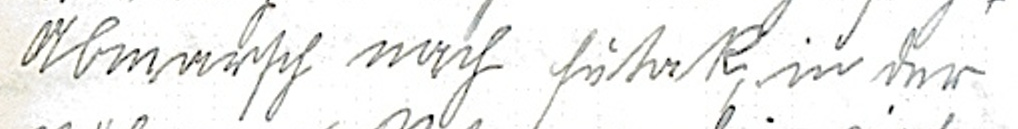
Abmarsch nach Futok in der
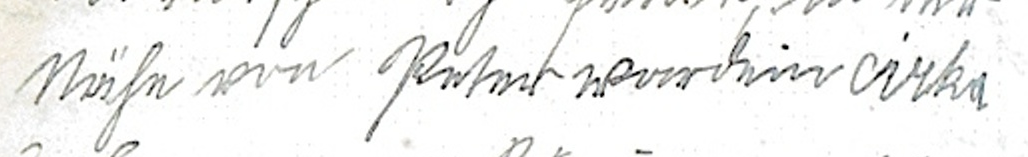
Nähe von Petrowaradin cirka
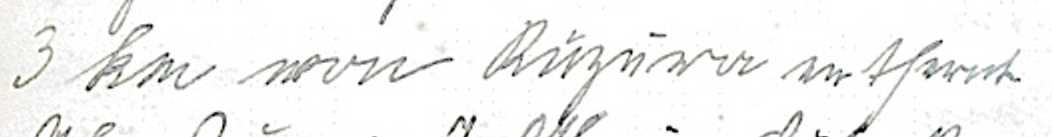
3 km von Kuz entfernt
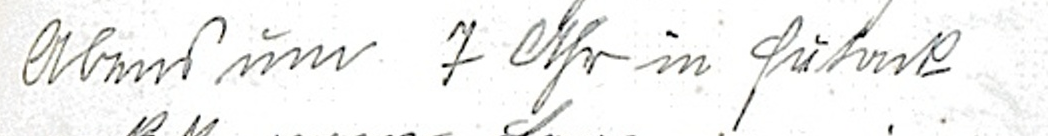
Abends um 7 Uhr im Futok
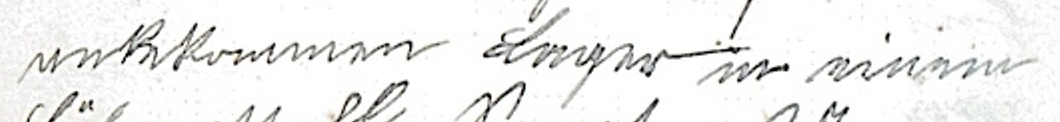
angekommen Lager in einem
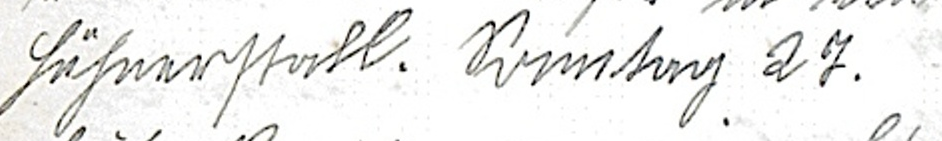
Hühnerstall. Sonntag 27.
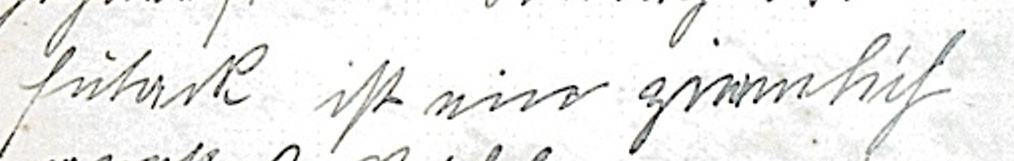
Futok ist ein ziemlich
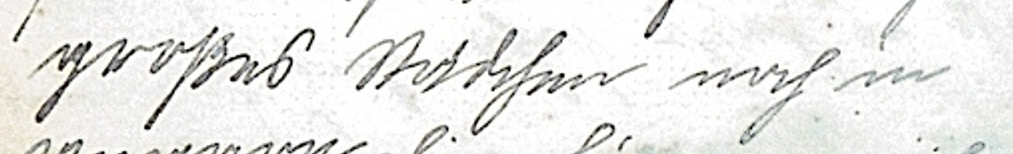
großes Staschen noch in
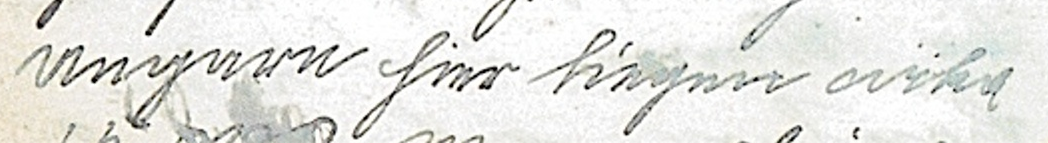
Ungarn hier liegen cirka
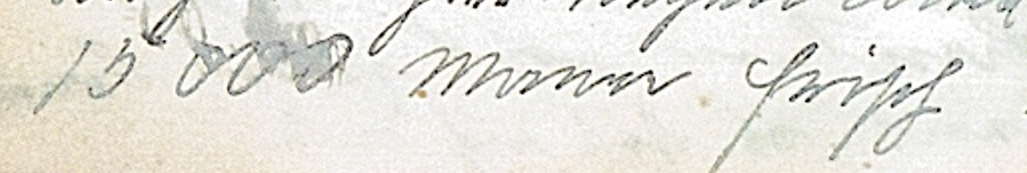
13 000 Mann frisch
